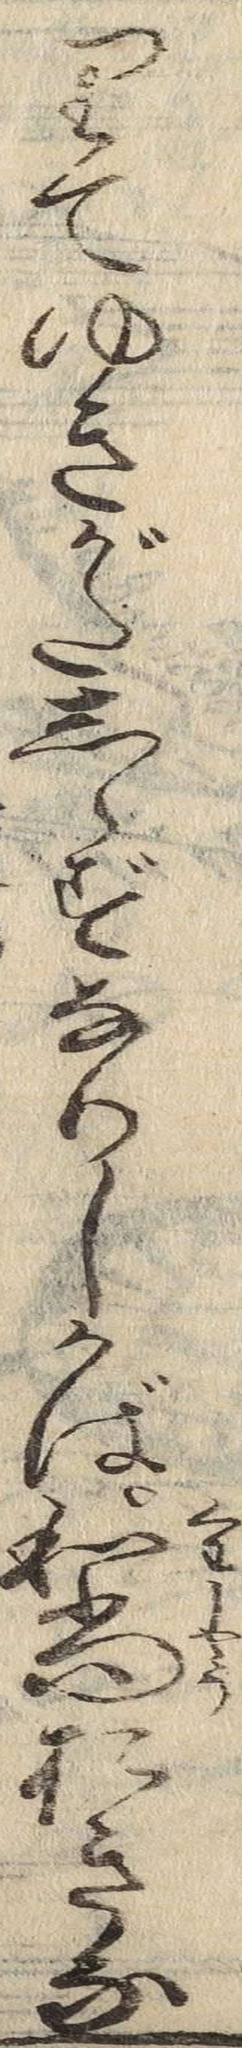りてゆきがたしらずなりしかば。和尚おきな
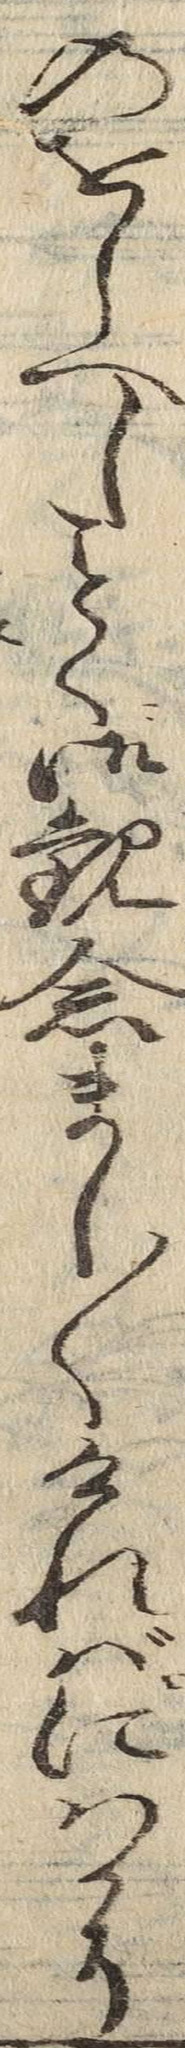のをしへしことく御観念まし〳〵ければ。にはかに
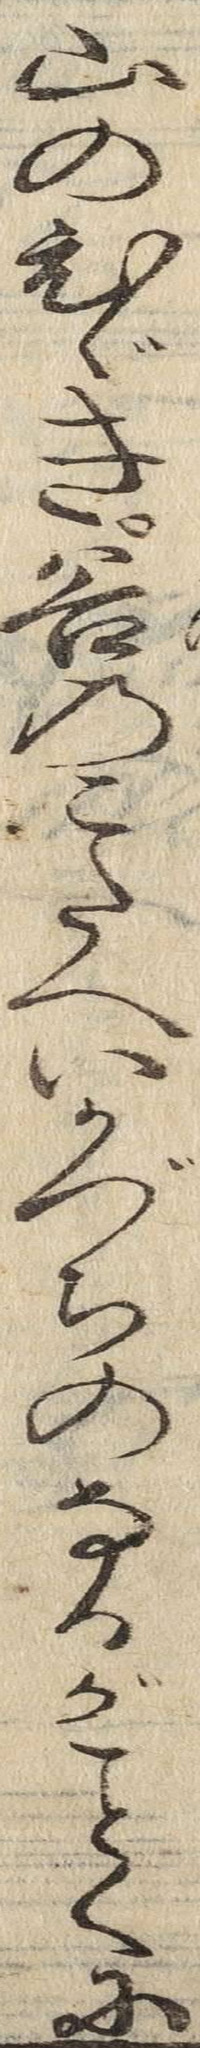山のひゞき。谷のこたへいかづちのなるがことくに
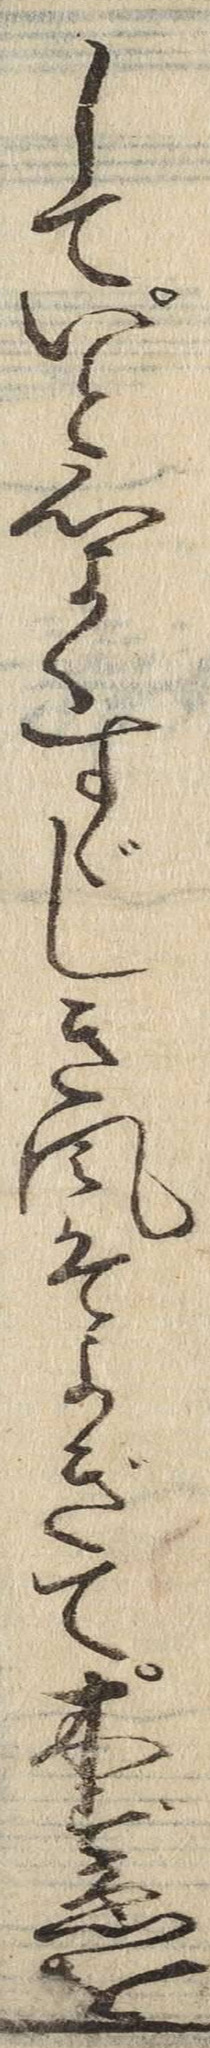して。いと心よくすゞしき風そよぎて。木ずゑを
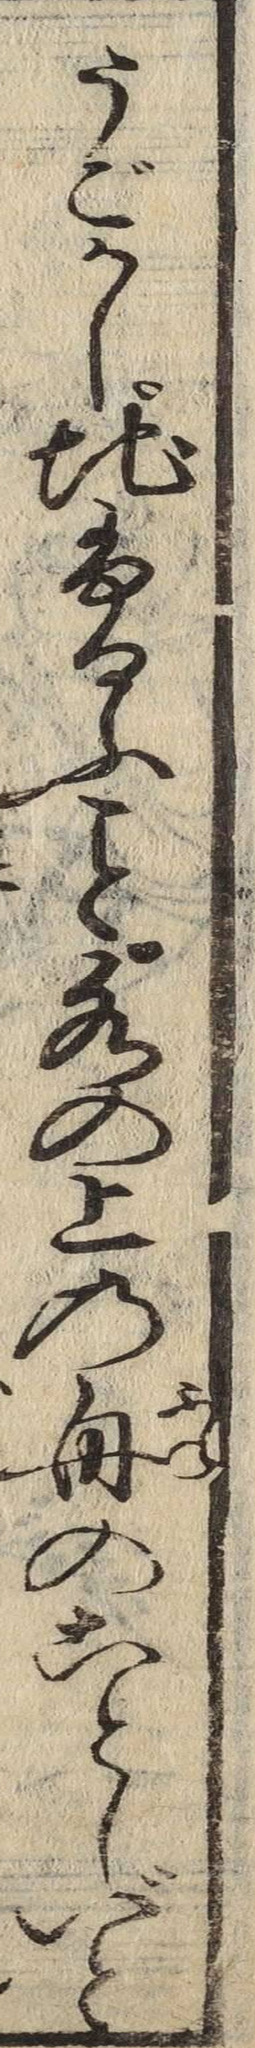うごかし。地ふるふこと。水の上の舟のことし。いと
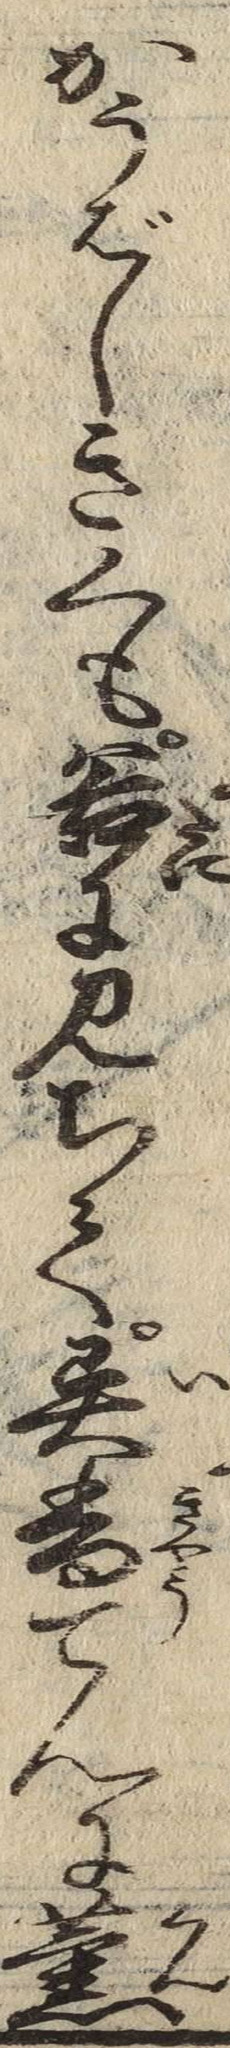かうばしきくも。谷にみちて。異香てんに薫
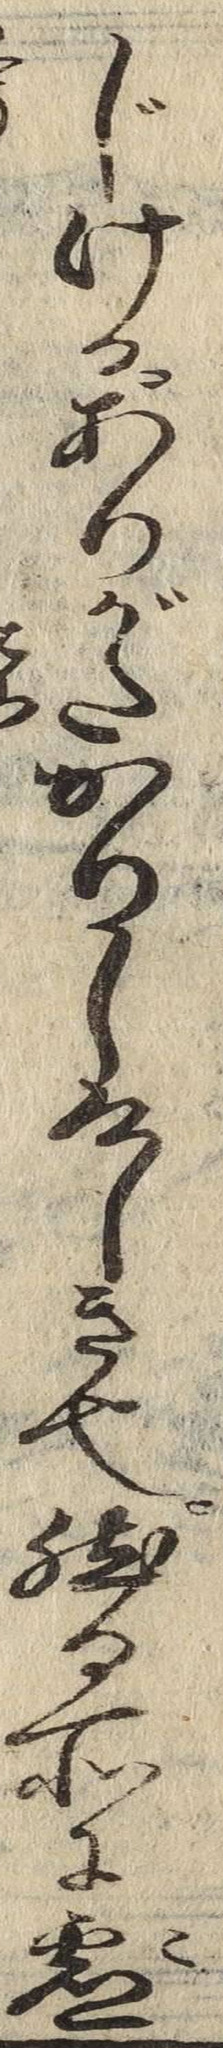じける。ありがたかりしけしき也。然る所に虚
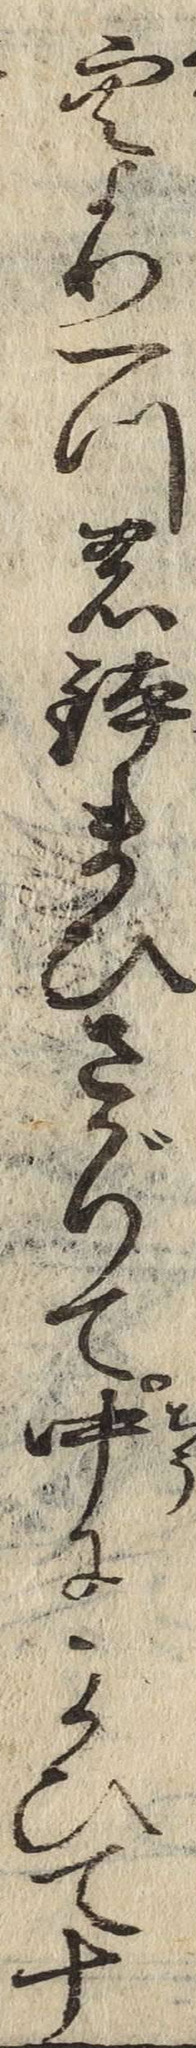空より一つの鉢まひさがりて。中にうかひて十
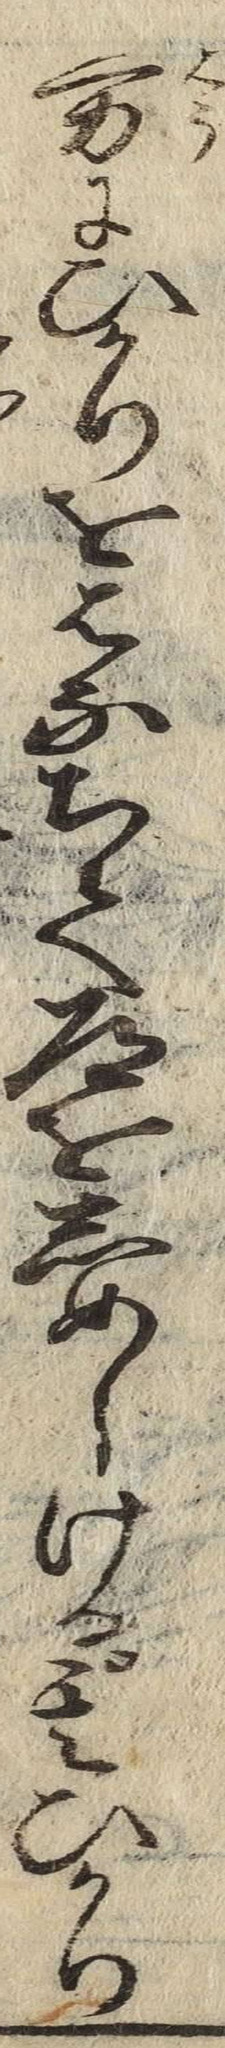方にひかりをはなちて道をしめしける。其ひかり
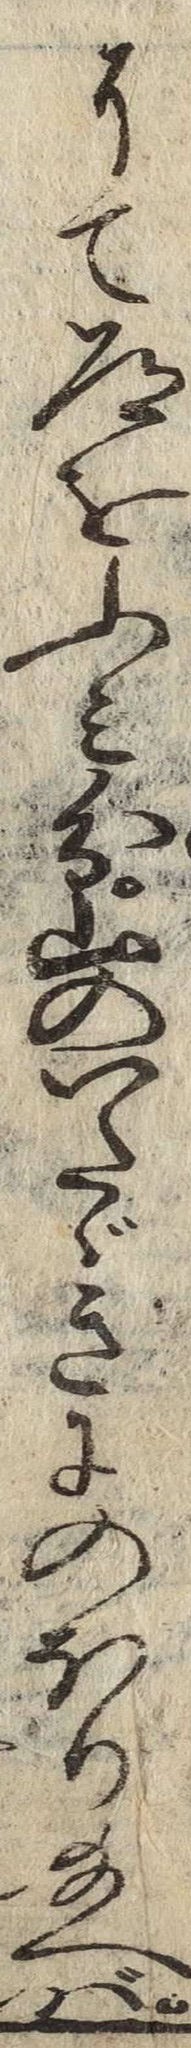にて道をふみ分。山のいたゞきにのぼり給へば。
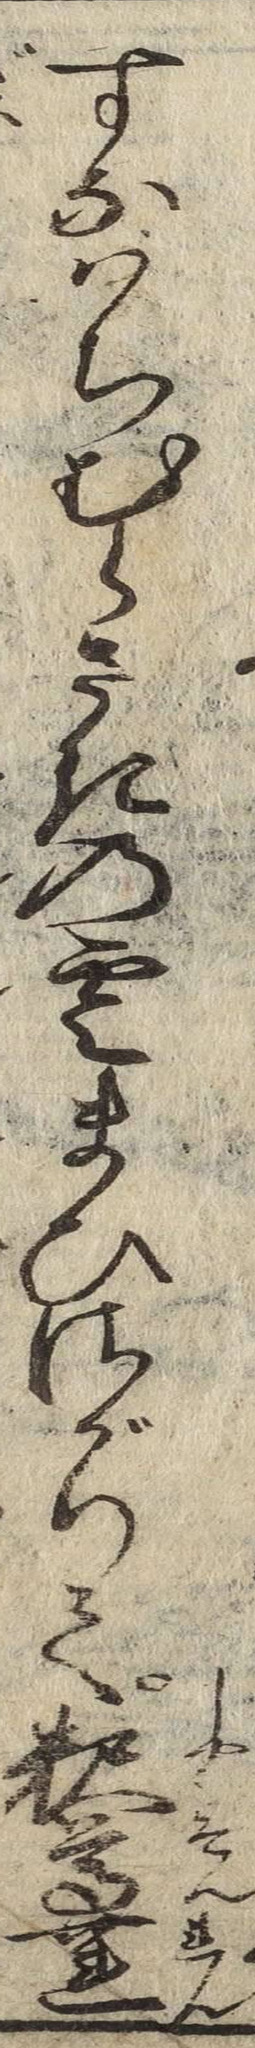すなはちむらさきの雲まひさがりて。釈尊蓮
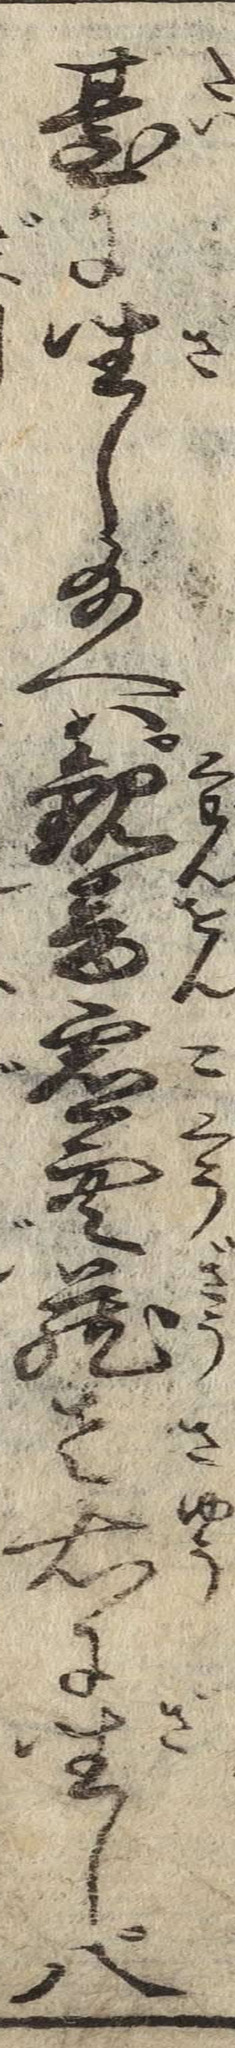台に座し給へは。観音虚空蔵左右に座し。鉢
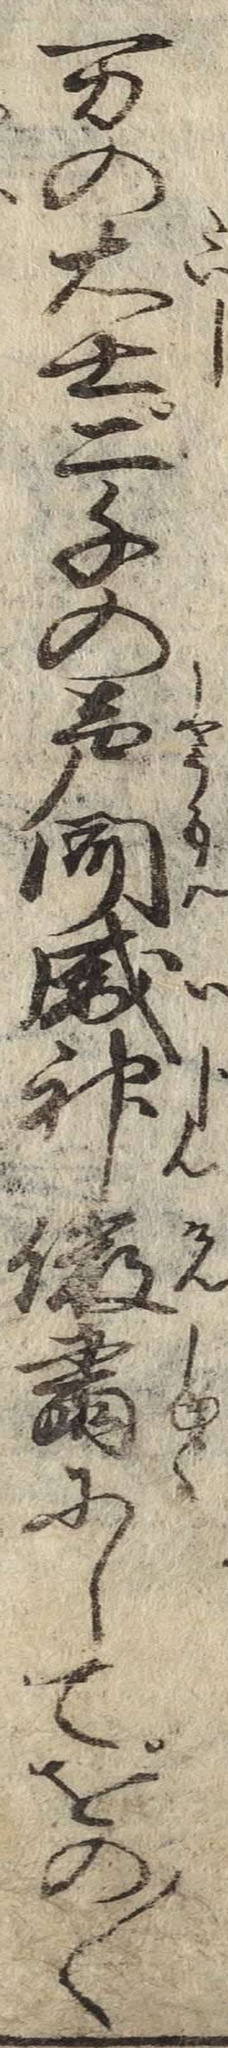万の大士千の声聞威神儼粛にしてをの〳〵
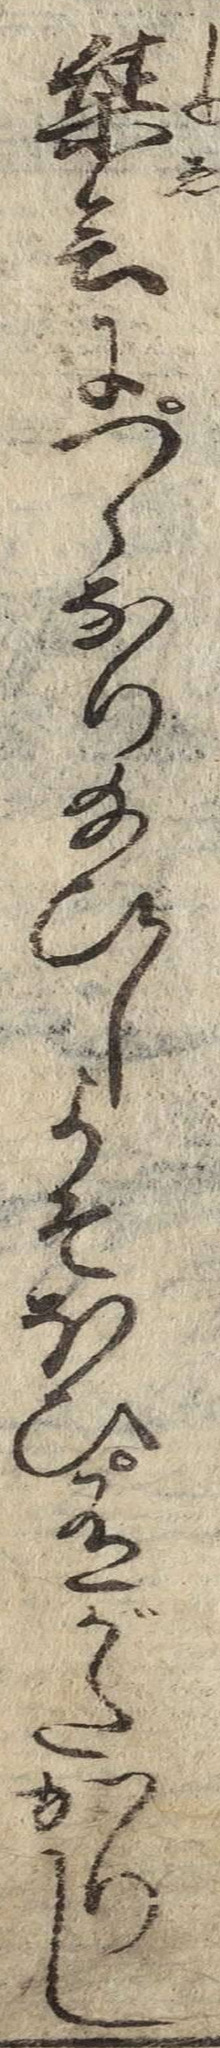集会に。つらなり給ひしよそほひ。有がたかりし
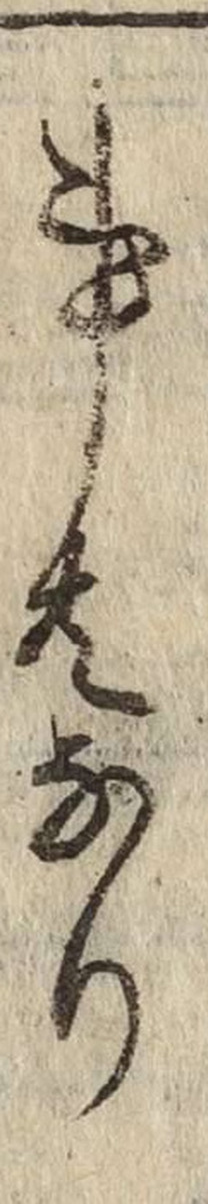事共なり

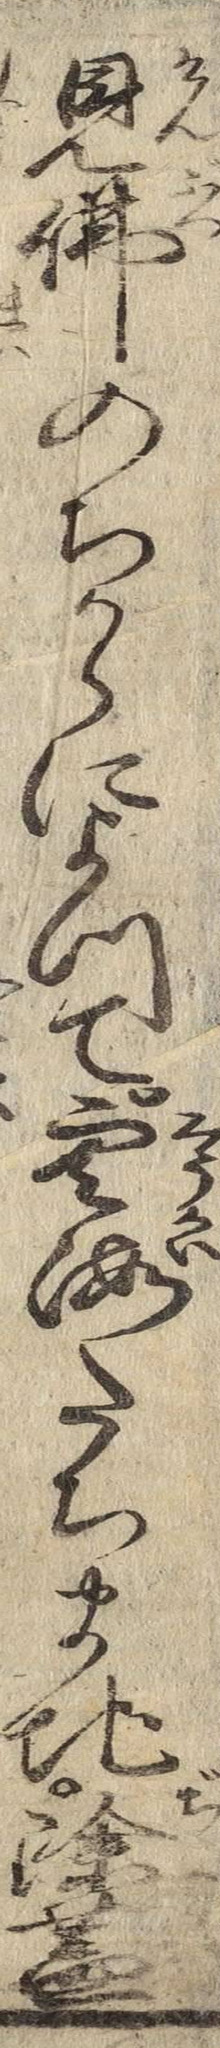見仏のちからによつて。空海たちまち除蓋
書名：弘法大師御傳記
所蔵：京都府立京都学・歴彩館 国文学研究資料館
